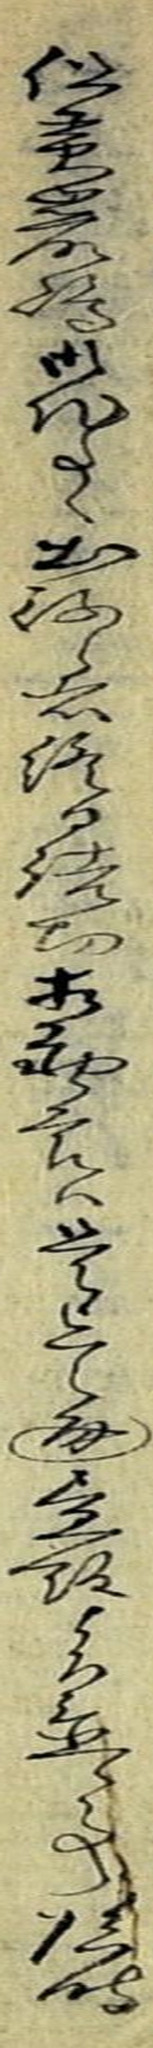但霊厳嶋御作事出役役之者終日詰切相勤候節は是迄之通昼飯被下置候事臨時
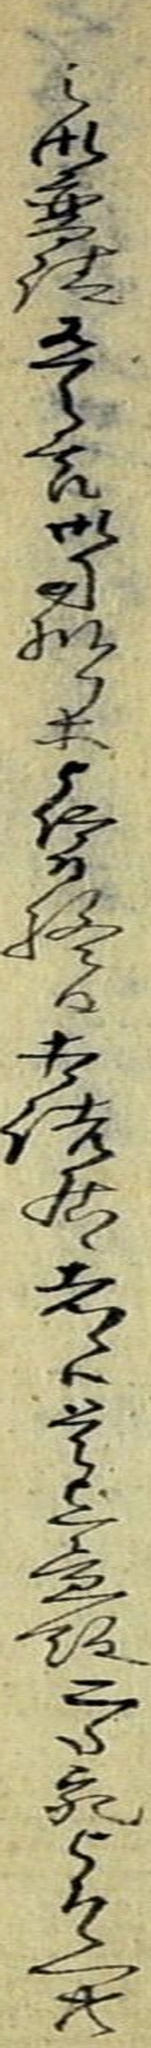之御普請有之節御用掛等被仰付終日相詰居候者は是迄昼飯二つ宛被下候へ共
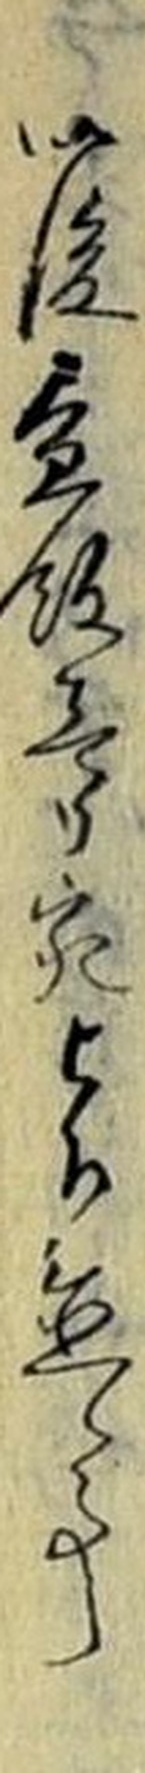以後昼飯壱つ宛被下置候事
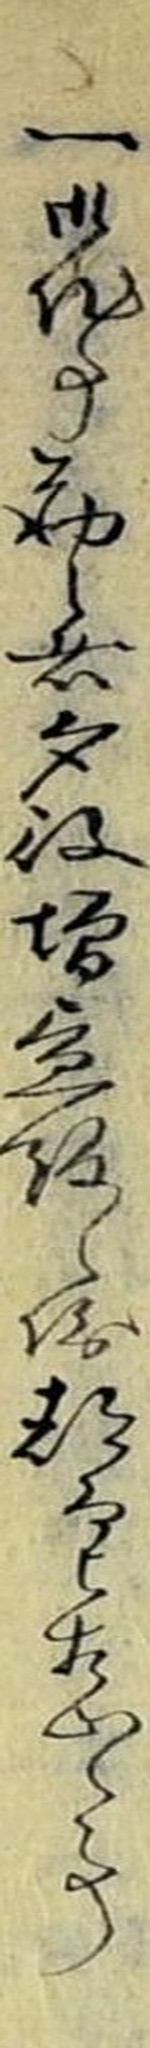一御作事勤之者夕役増昼飯之儀都而被相止候事
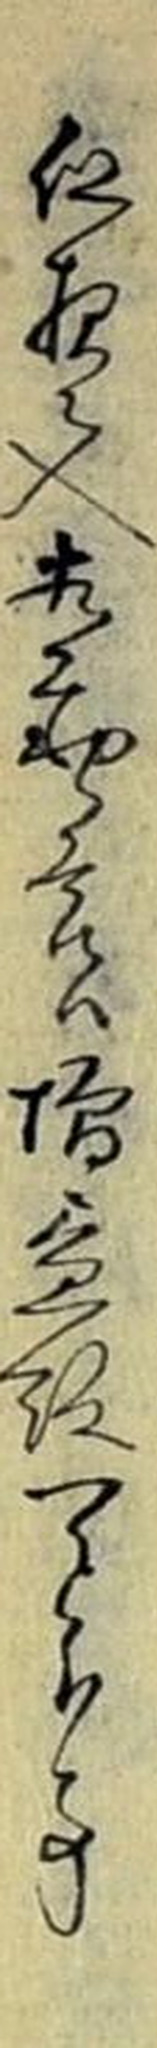但夜に入相勤候節は増昼飯可被下事
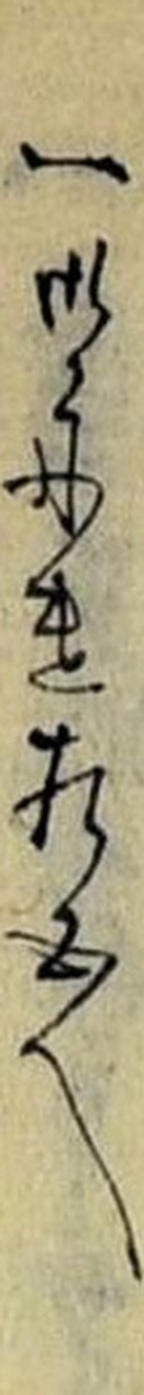一御舟遣拾五人
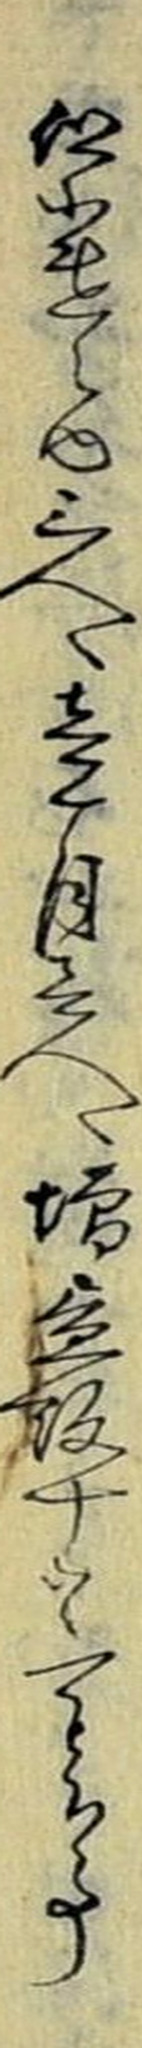但小遣之内三人へ壱月壱人へ増昼飯十つヽ可被下事
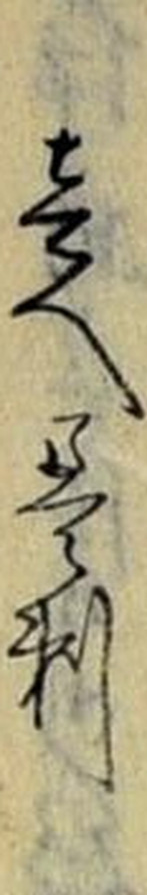壱人畳刺
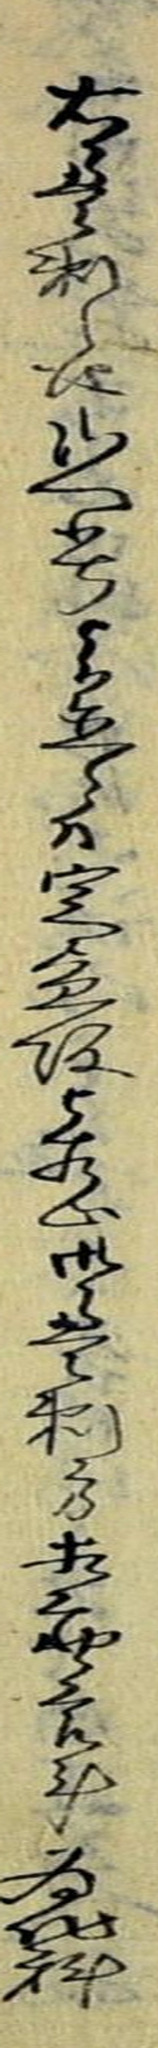右畳刺之儀弐人ふち被下置候に付定昼飯被相止御畳刺方相勤候節斗為作料
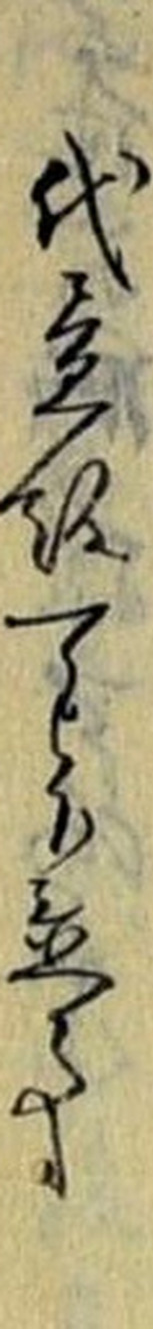代昼飯可被下置候事
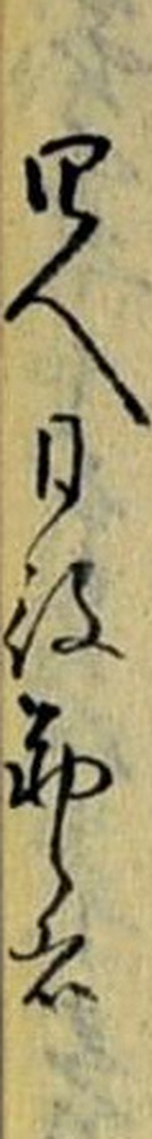四人日役勤之物
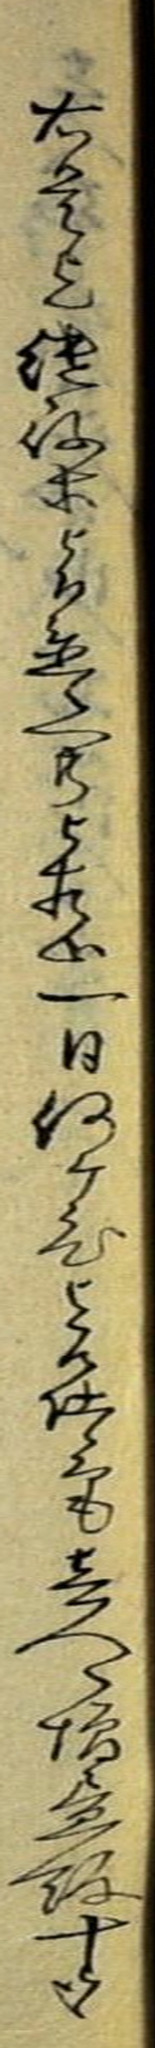右是迄継役等被下置候へ共被相止一日何ヶ度被召仕候而も壱人へ増昼飯十つヽ
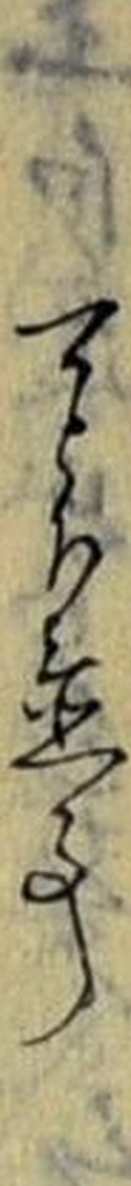可被下置事
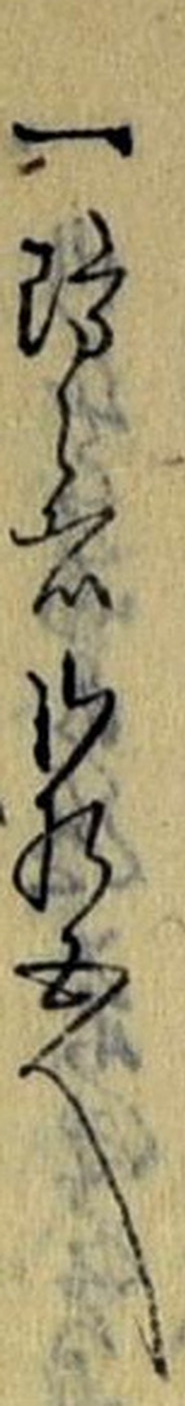一防之者弐拾五人
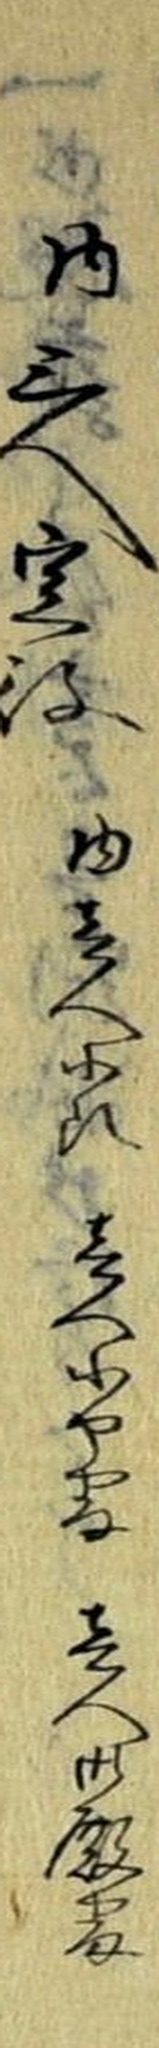内三人定役内壱人小頭壱人小や番壱人御殿番
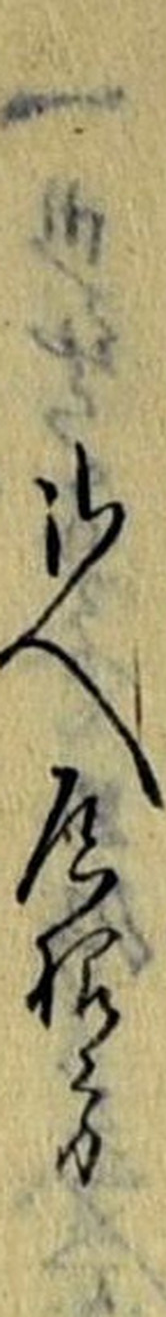弐人屋根方
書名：命令之部 四
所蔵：福井県文書館 Fukui Prefectural Archives
